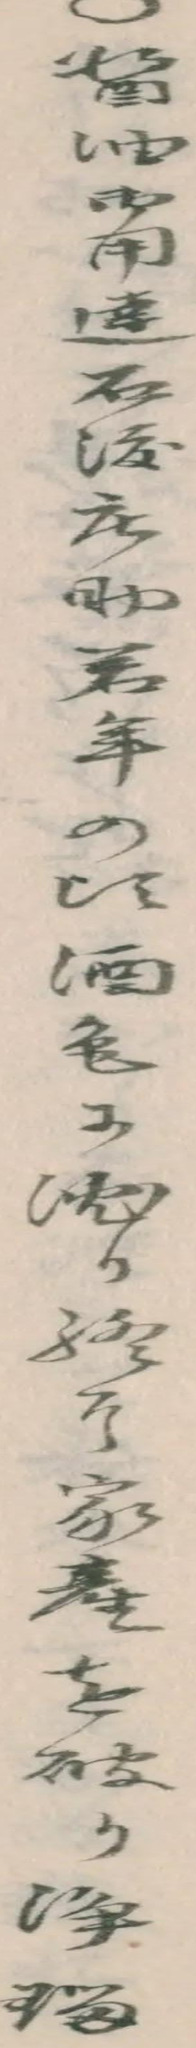〇醤油御用達石渡庄助若年の頃酒色に沈り終に家産を破り浄瑠
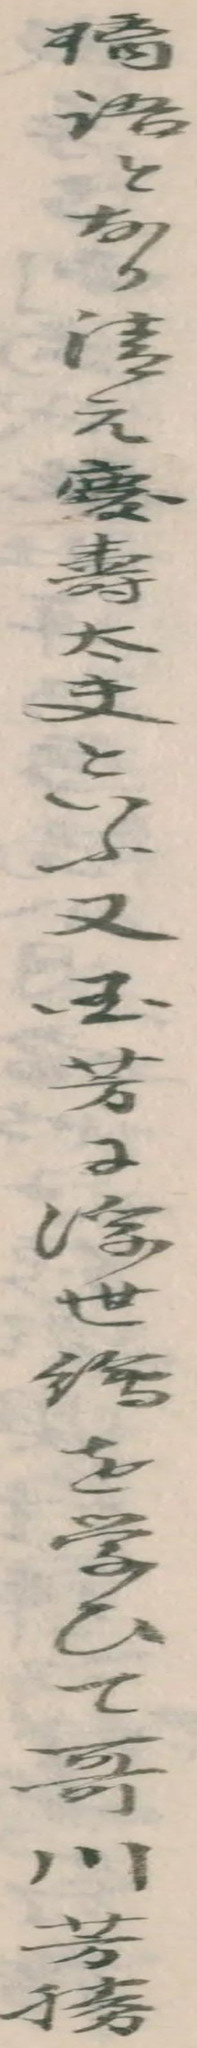璃語となり清元慶寿太夫といふ又国芳に浮世絵を学ひて哥川芳勝
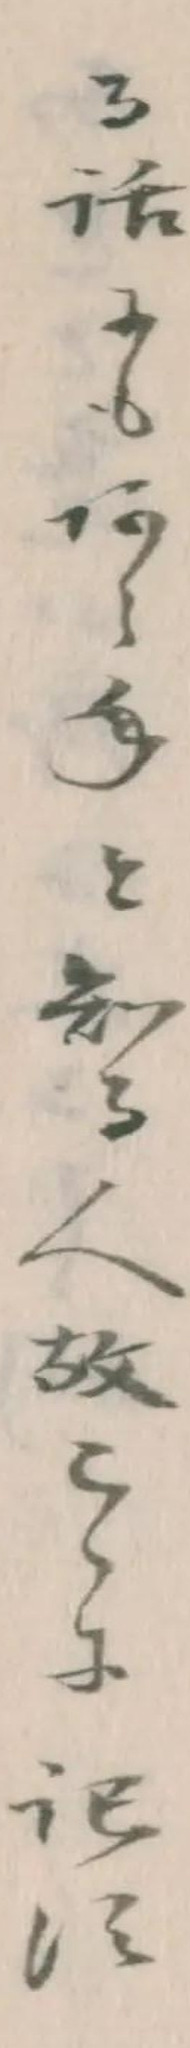る話にもあらねと知る人故こゝに記す
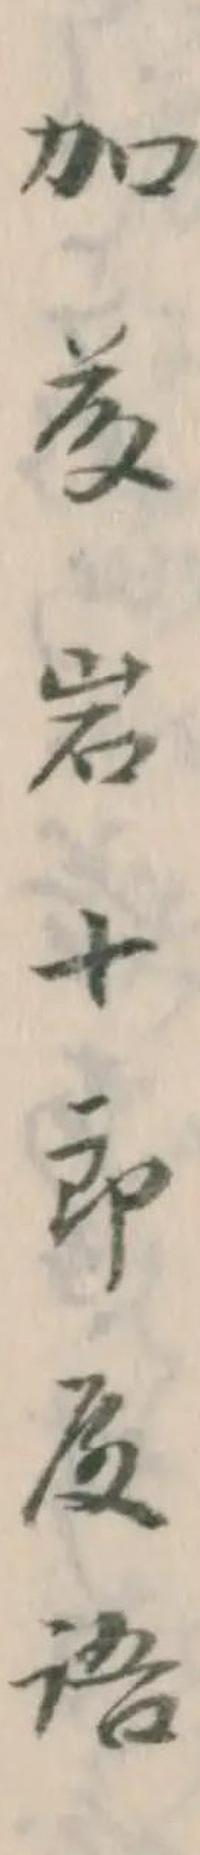加藤岩十郎殿話
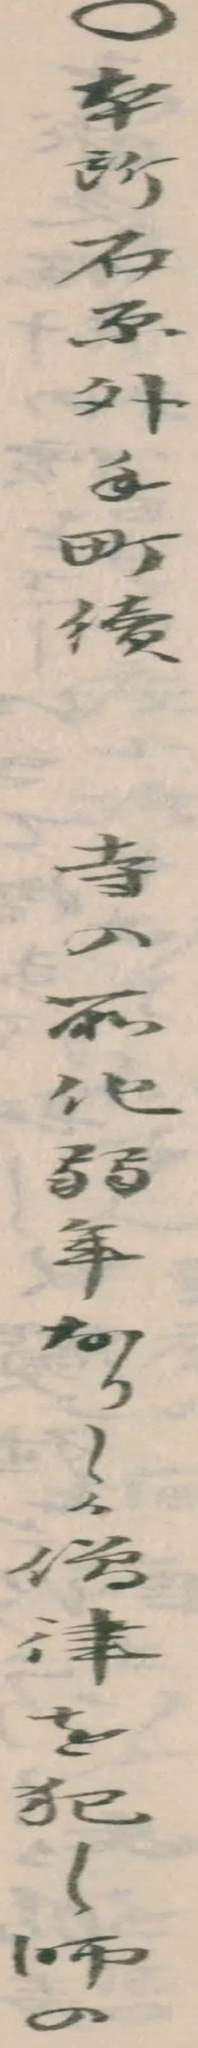〇本所石原外手町続寺の所化弱年なりしか僧律を犯し師の
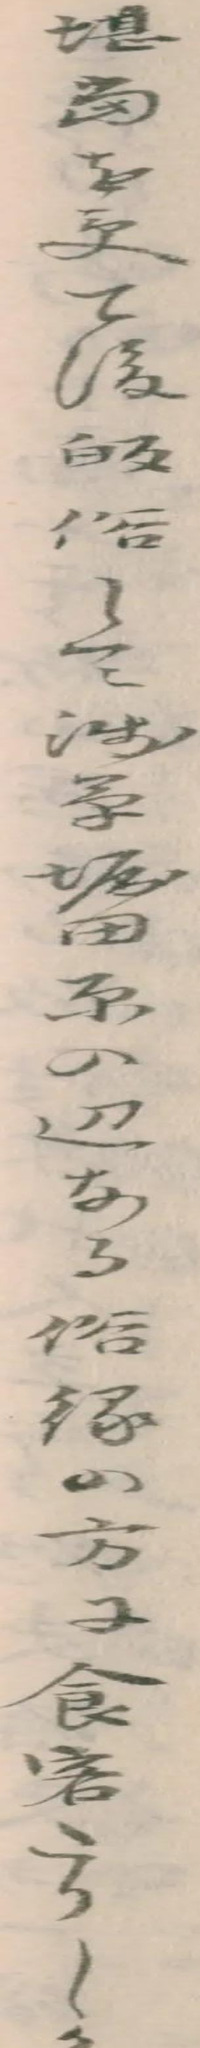勘当を受て後皈俗して浅草堀田原の辺なる俗縁の方に食客たりしか
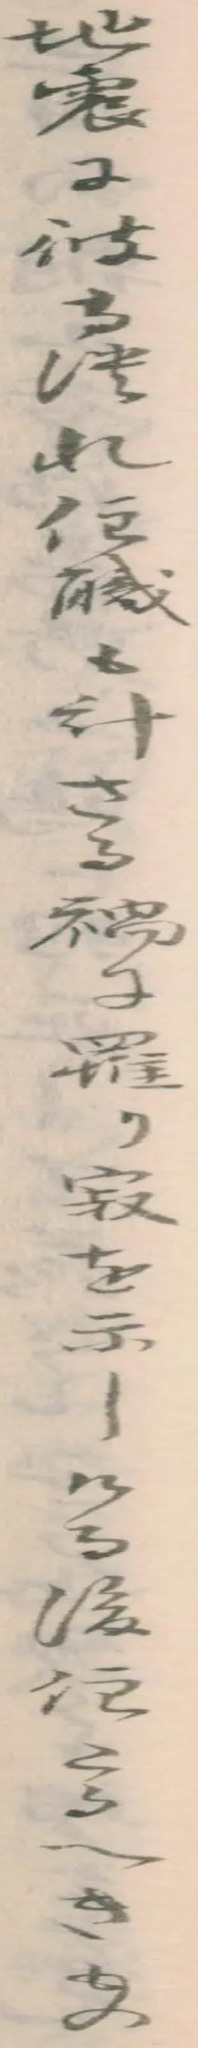地震に彼寺潰れ住職も計さる禍に罹り寂を示しける後住たるへきもの
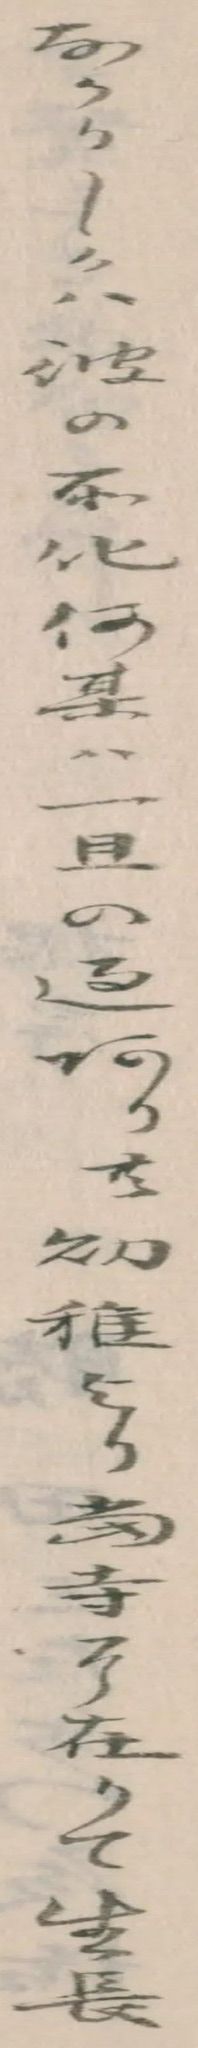なかりしかは彼の所化何某は一旦の過あり共幼稚より当寺に在りて生長
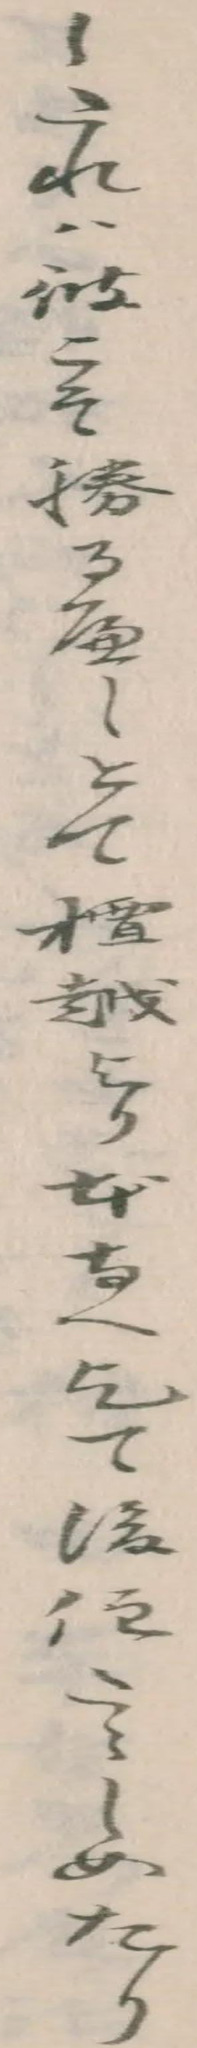したれは彼こそ勝るへしとて檀越より本寺へ乞て後住たらしめたり
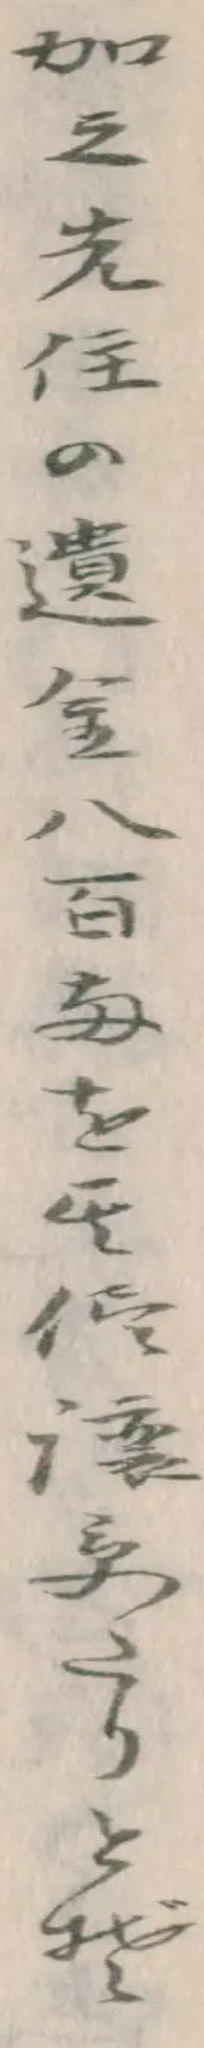加え先住の遺金八百両を其儘譲受たりとぞ
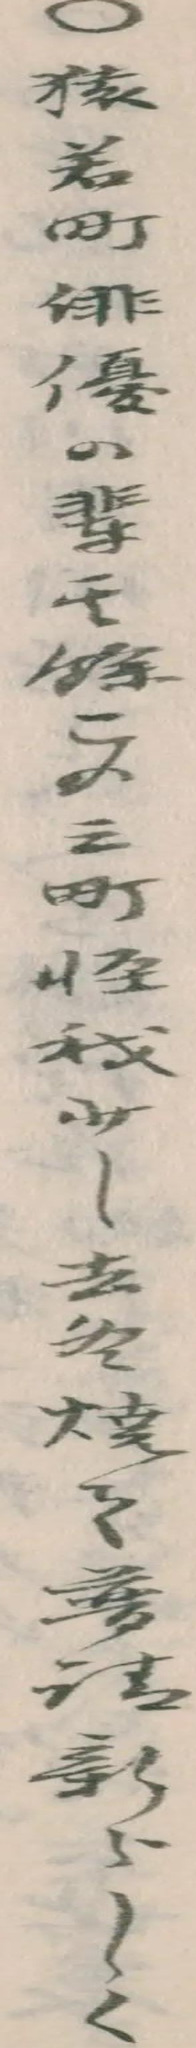〇猿若町俳優の輩其余この三町怪我少し去冬焼て普請新らしく
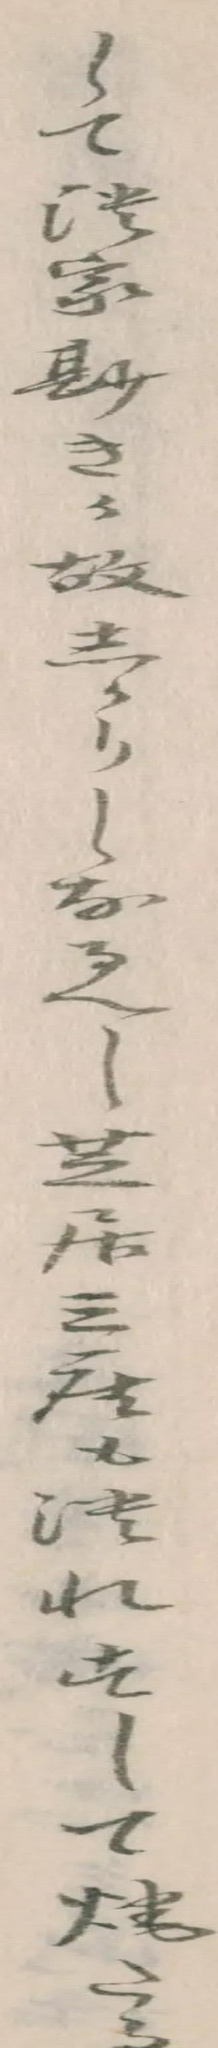して潰家尠きか故しかりしなるへし芝居三座も潰れすして焼たる
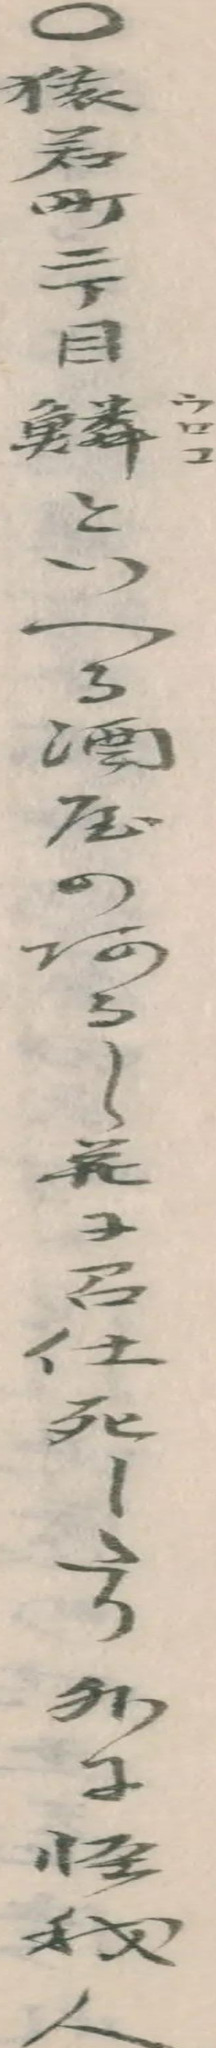〇猿若町二丁目鱗といへる酒屋のあるし并に召仕死したり外に怪我人
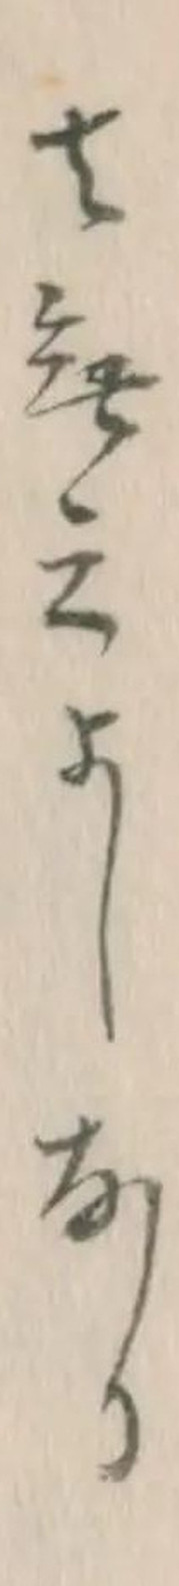は無之よしなり

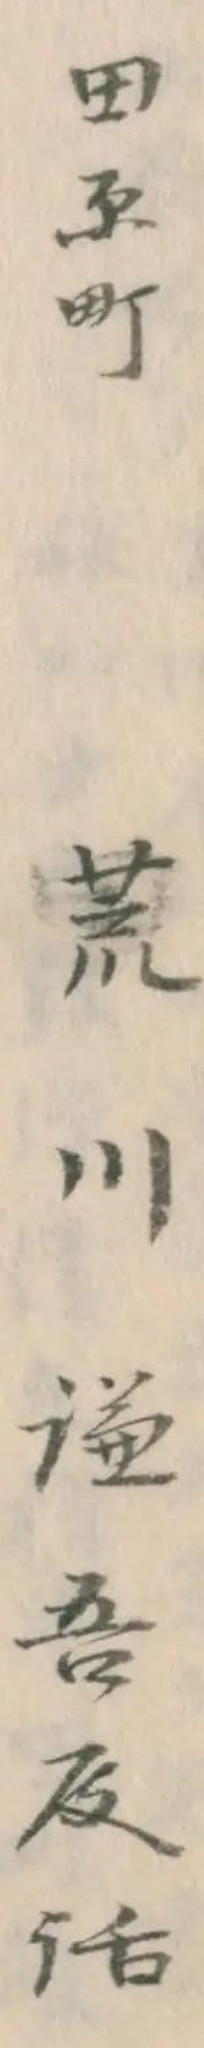田原町荒川謙吾殿話
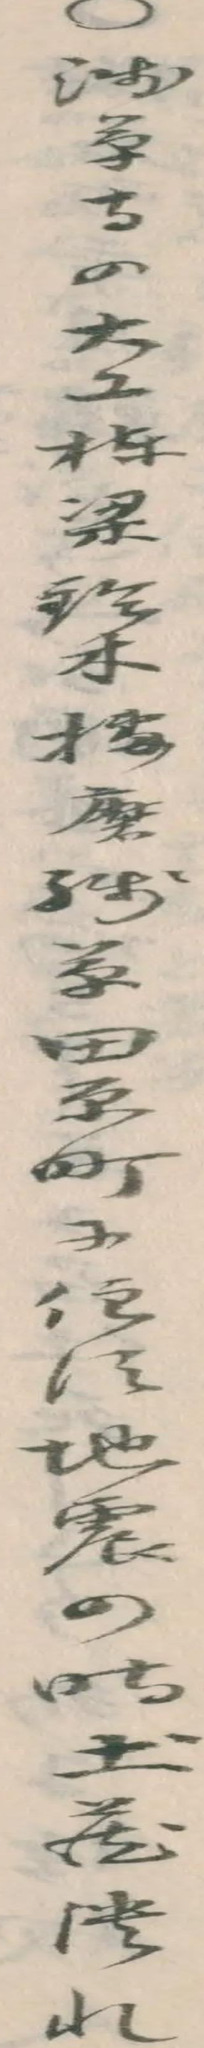〇浅草寺の大工棟梁鈴木橘麿浅草田原町に住す地震の時土蔵潰れ
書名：地災撮要. 巻7-9(地震之部)
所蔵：国立国会図書館 National Diet Library, JAPAN
